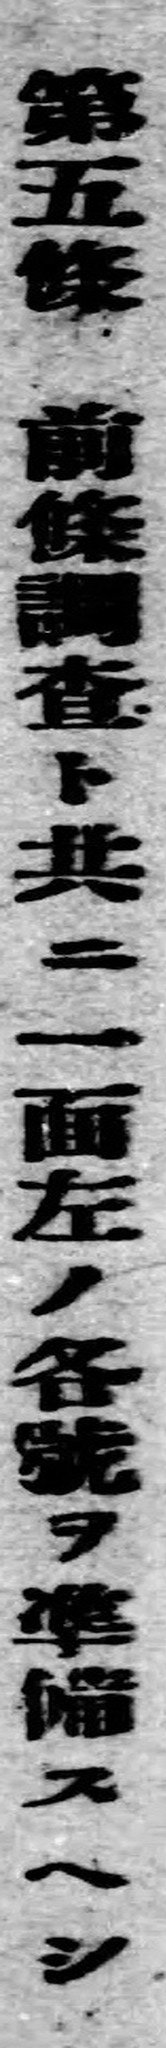第五條前條調査ト共ニ一面左ノ各號ヲ準備スヘシ
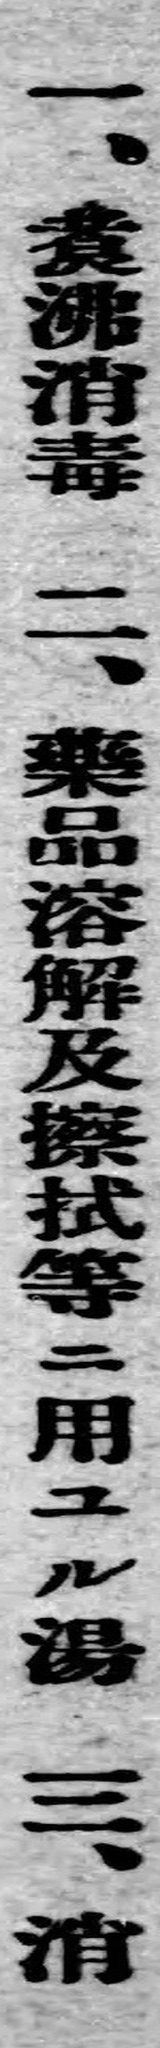一、煑沸消毒二、藥品溶解及擦拭等ニ用ユル湯三、消
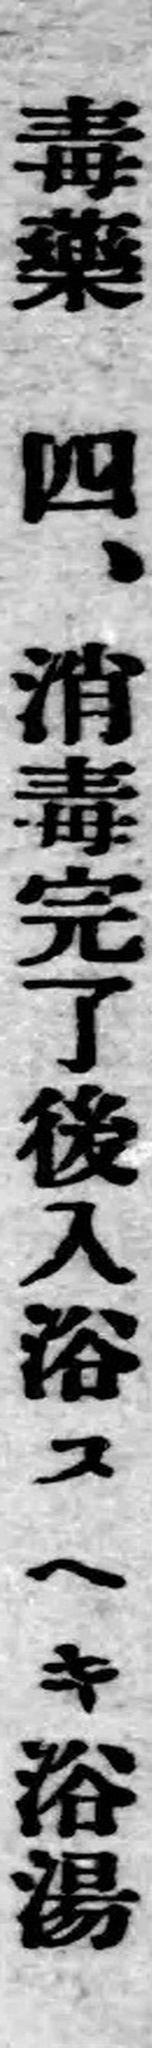毒藥四、消毒及完了後入浴スヘキ浴湯
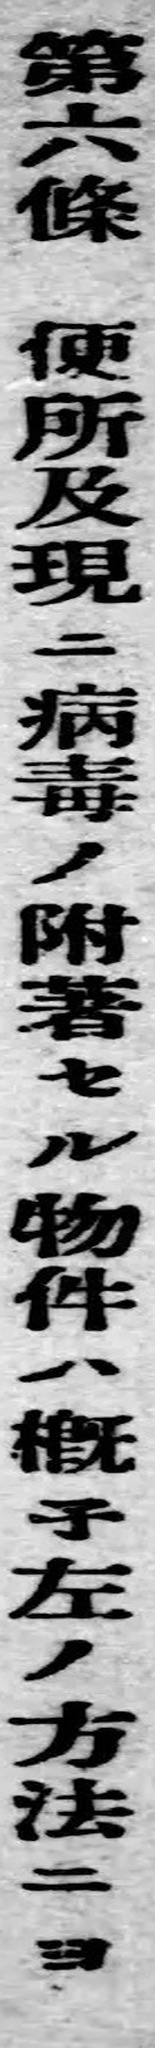第六條便所及現ニ病毒ノ附著セル物件ハ槪ネ左ノ方法ニヨ
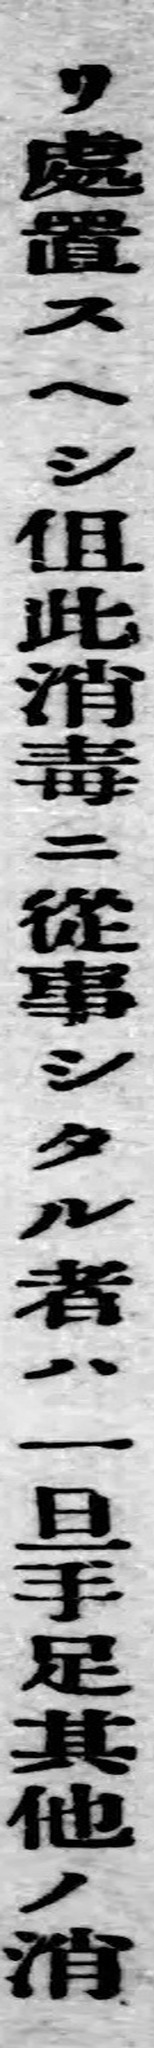リ處置スヘシ但此消毒ニ從事シタル者ハ一旦手足其他ノ消
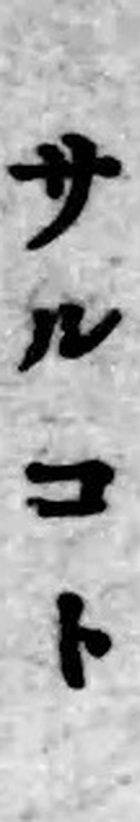サルコト
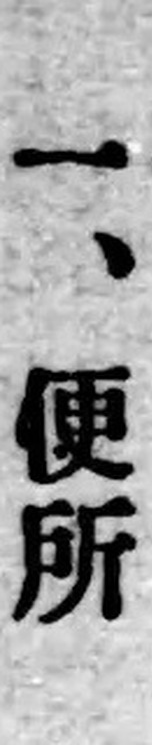一、便所
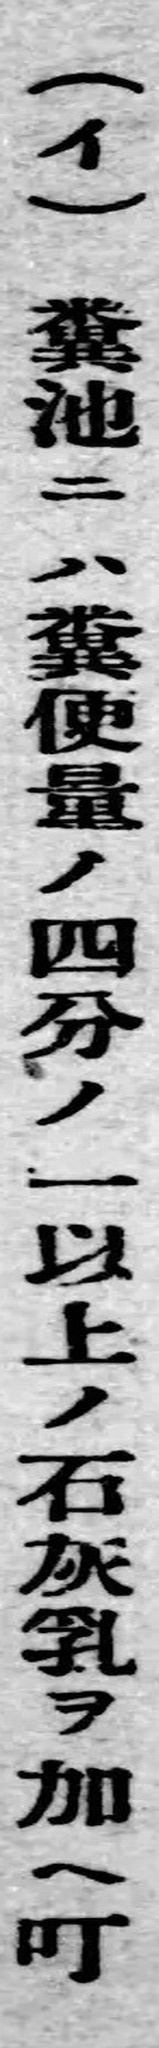(イ)糞池ニハ糞便量ノ四分ノ一以上ノ石灰乳ヲ加ヘ叮
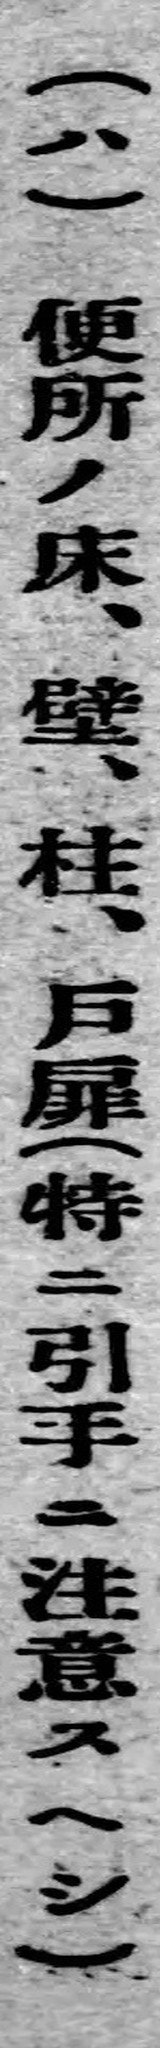(ハ)便所ノ床、壁、柱、戸扉(特ニ引手ニ注意スヘシ)

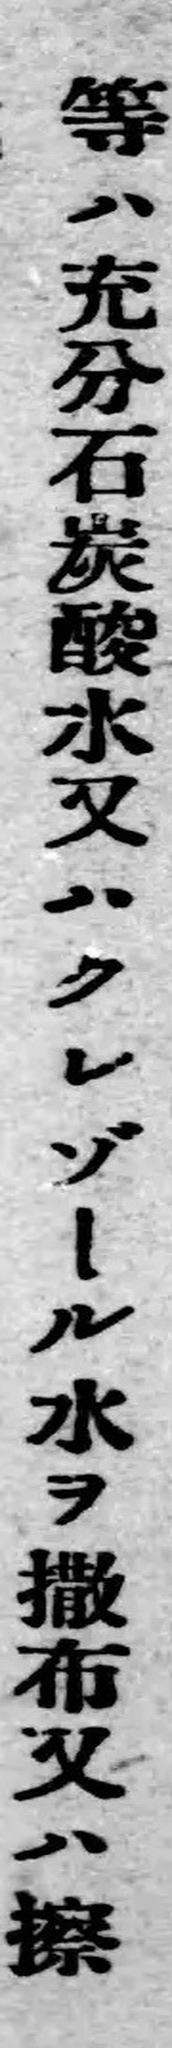等ハ充分石炭酸水又ハクレゾール水ヲ撒布又ハ擦
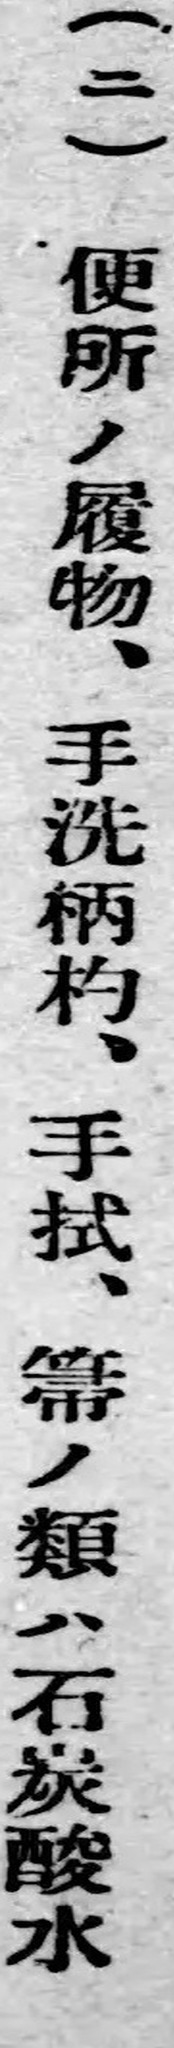(ニ)便所ノ履物、手洗柄杓、手拭、箒ノ類ハ石炭酸水
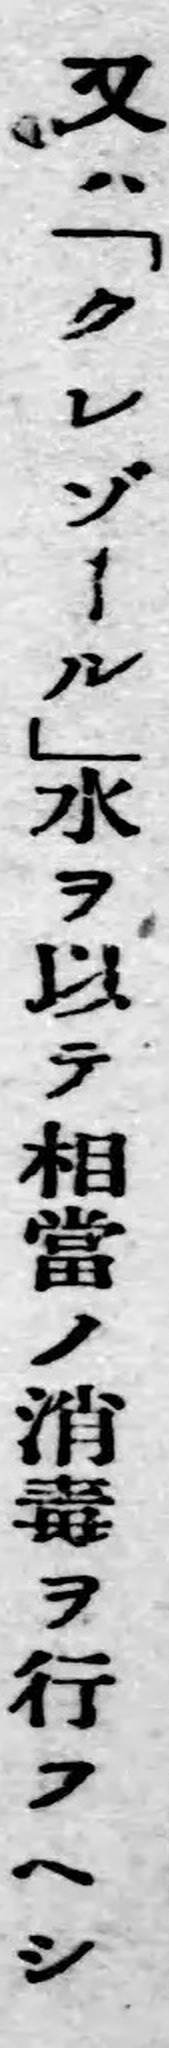又ハ「クレゾール」水ヲ以テ相當ノ消毒ヲ行フヘシ
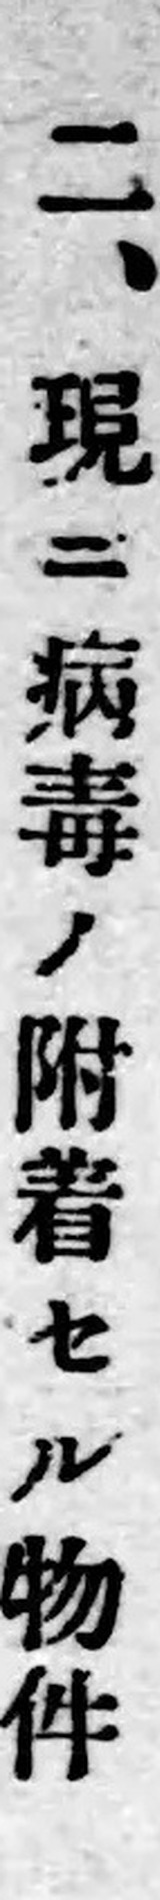二、現ニ病毒ノ附着セル物件
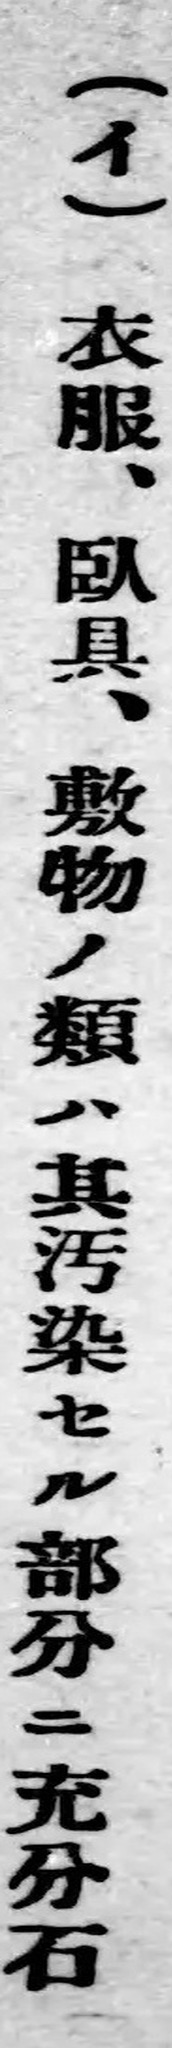(イ)衣服、臥具、敷物ノ類ハ其汚染セル部分ニ充分石
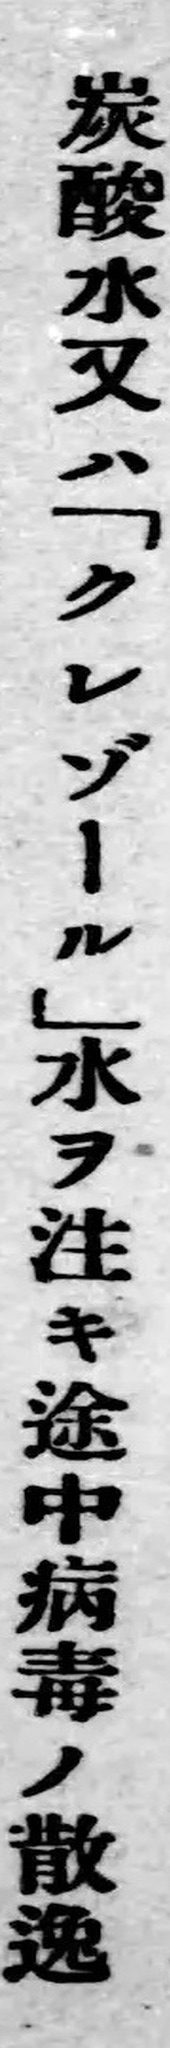炭酸水又ハ「クレゾール」水ヲ注キ途中病毒ノ散逸
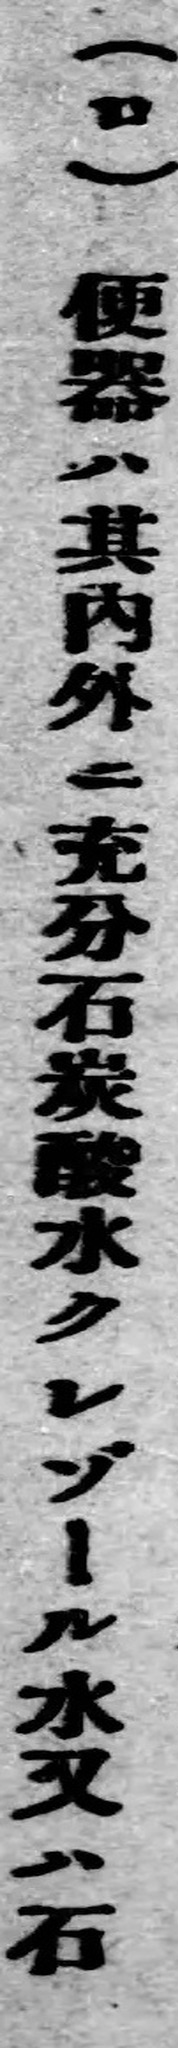(ロ)便器ハ其内外ニ充分石炭酸水クレゾール水又ハ石
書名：袖珍防疫必携
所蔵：国立国会図書館 National Diet Library, JAPAN
